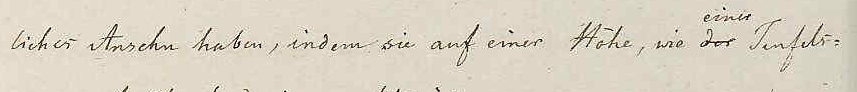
liches Ansehn haben, indem sie auf einer Höhe, wie dereiner Teufels-
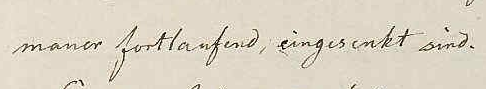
mauer fortlaufend eingesenkt sind.
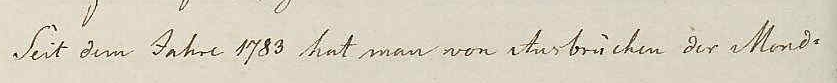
Seit dem Jahre 1783 hat man von Ausbrüchen der Mond-
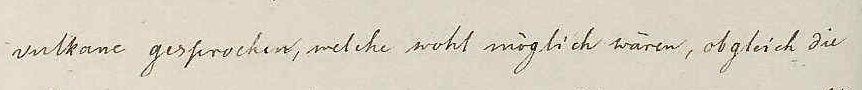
vulkane gesprochen, welche wohl möglich wären, obgleich die
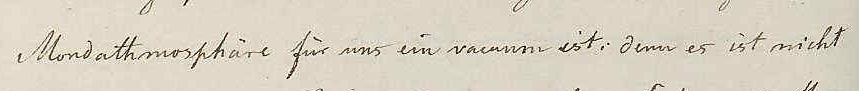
Mondathmosphäre für uns ein vacuum ist: denn es ist nicht
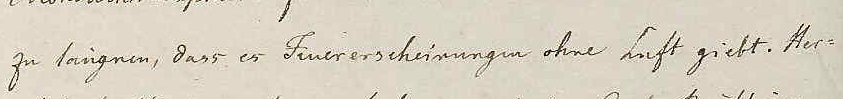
zu läugnen, dass es Feuererscheinungen ohne Luft giebt. Her-
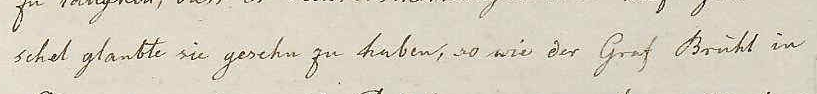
schel glaubte sie gesehn zu haben, so wie der Graf Brühl in
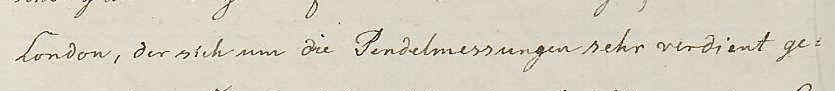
London, der sich um die Pendelmessungen sehr verdient ge-
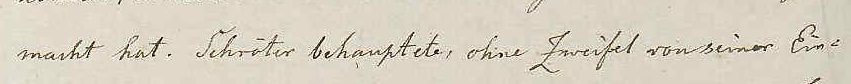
macht hat. Schröter behauptete, ohne Zweifel von seiner Ein-
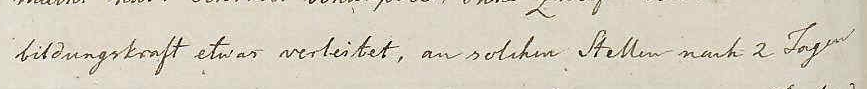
bildungskraft etwas verleitet, an solchen Stellen nach 2 Tagen
